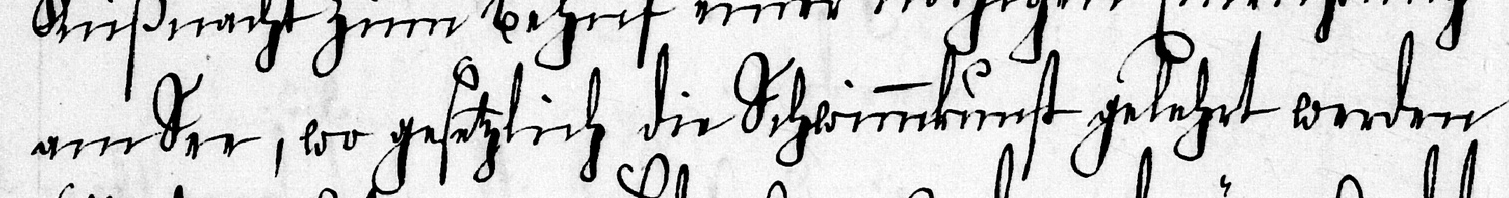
am See, wo gesetzlich die Schwimmkunst gelehrt werden
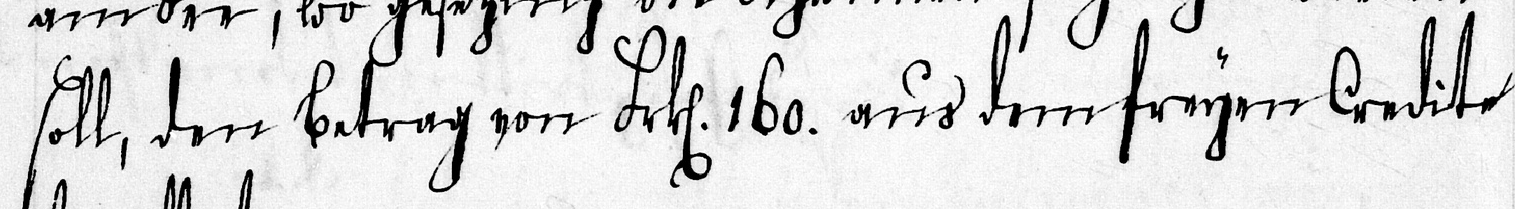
soll, den Betrag von Frk[en]. 160. aus dem freyen Credite
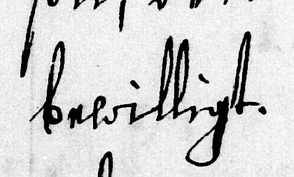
bewilligt.
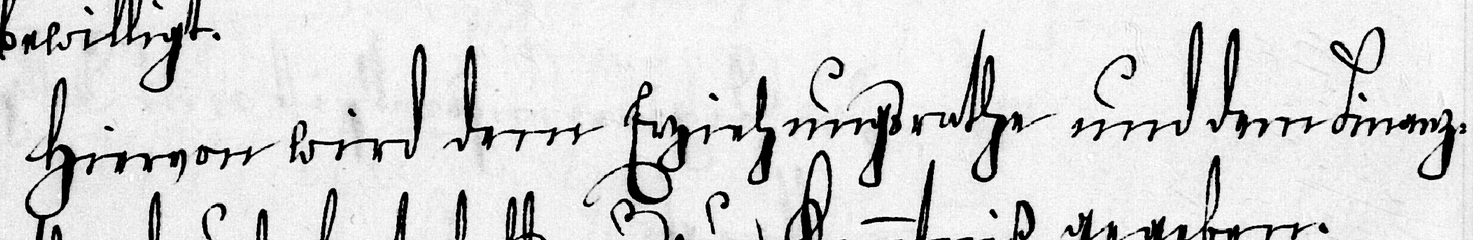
Hiervon wird dem Erziehungsrathe und dem Finan¬
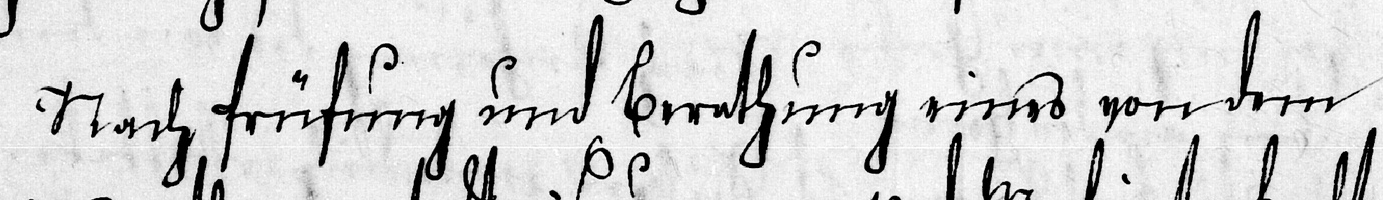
Nach Prüfung und Berathung eines von dem
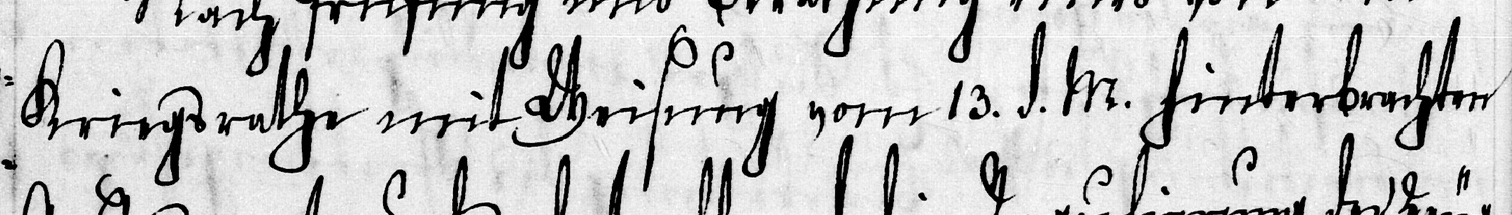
Kriegsrathe mit Weisung vom 13. d. M. hinterbrachten
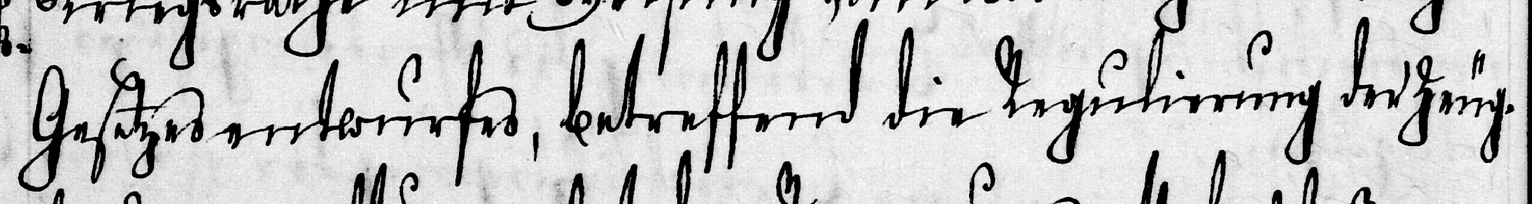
Gesetzesentwurfes, betreffend die Regulierung der Zeug¬
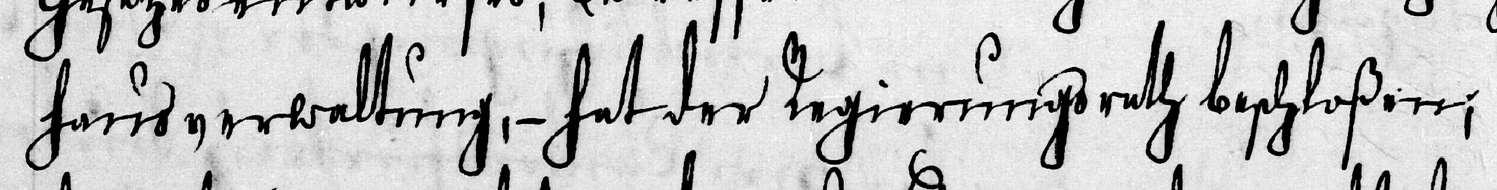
hausverwaltung, – hat der Regierungsrath beschloßen,
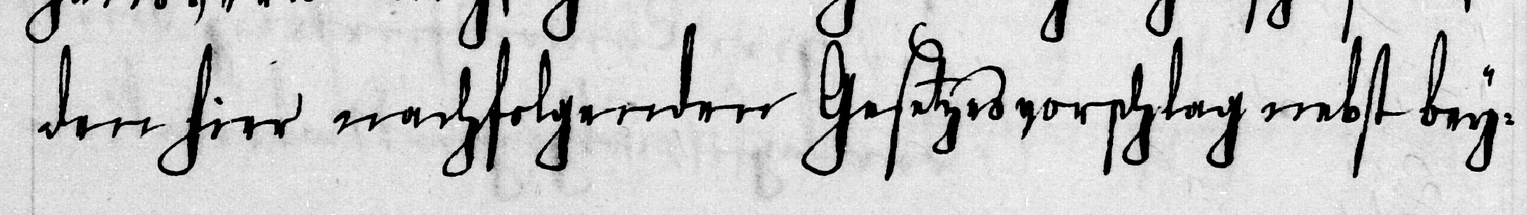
den hier nachfolgenden Gesetzesvorschlag nebst bey-
